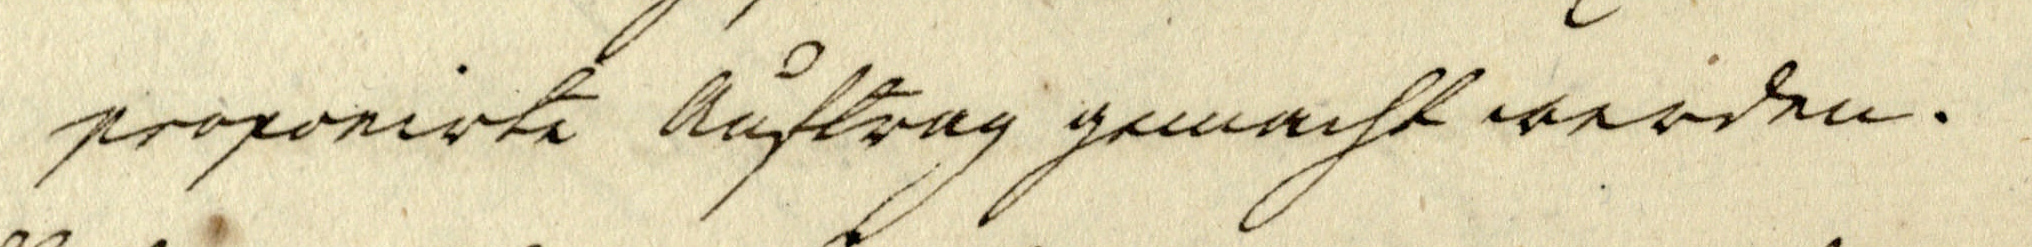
proponirte Auftrag gemacht werden.
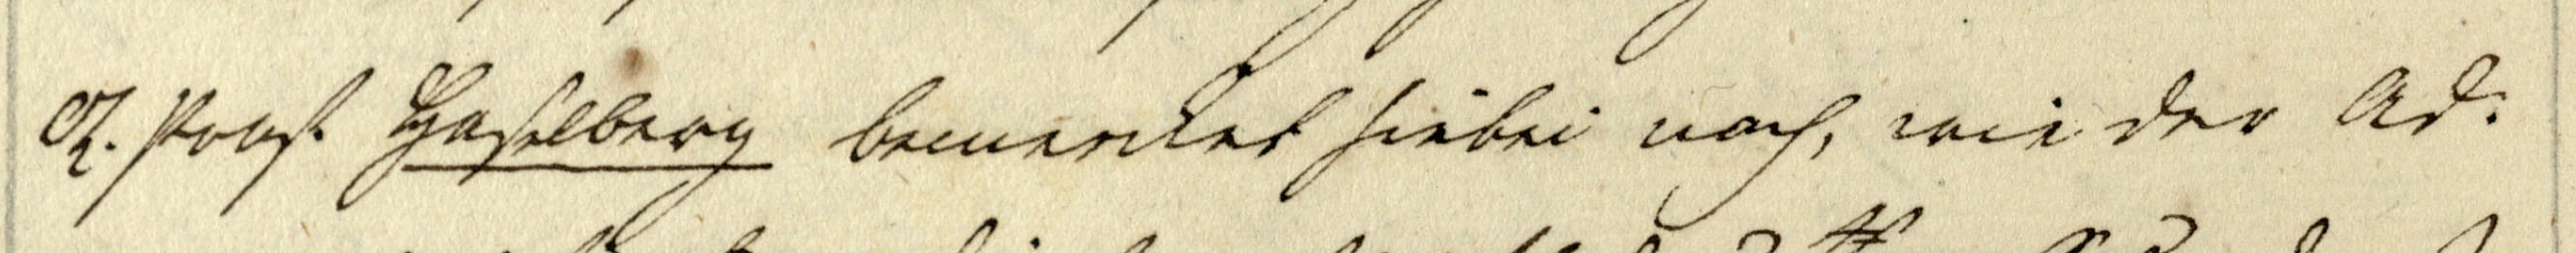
dh. Prof. Haselberg bemercket hiebei noch, wie der Ad¬
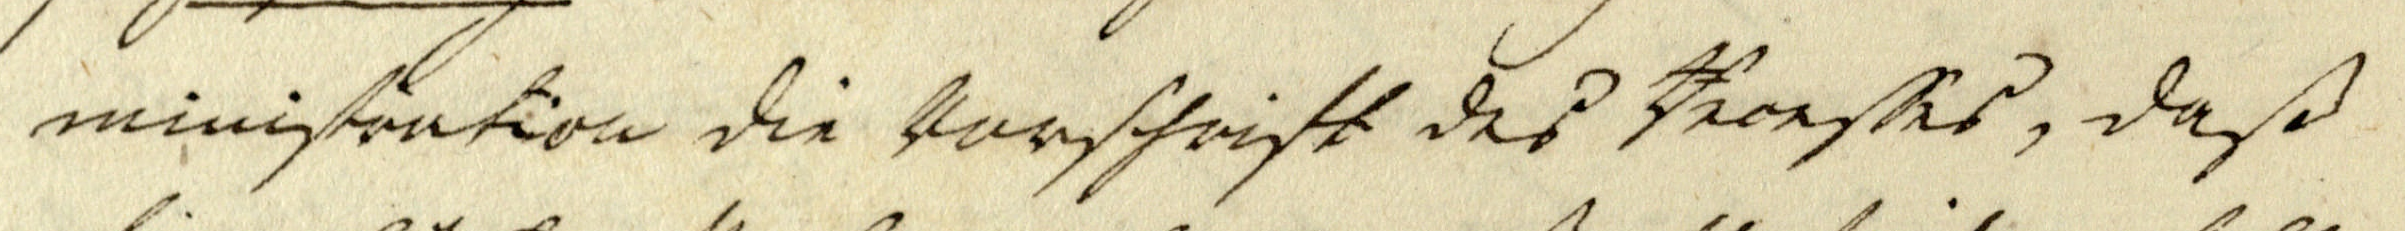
ministration die Vorschrift der Recesses, daß
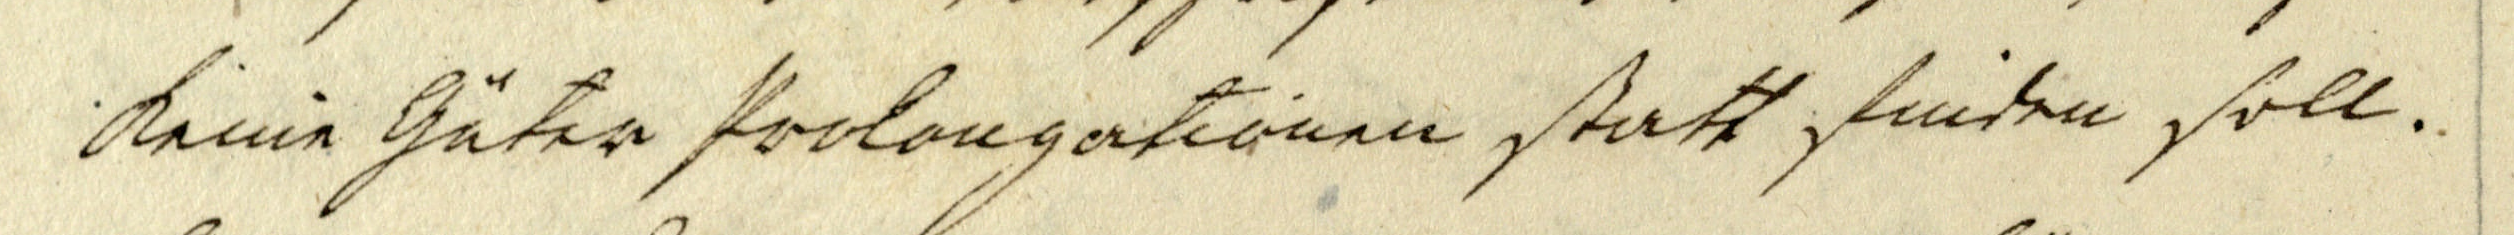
keine Güter Prolongationen statt finden soll¬
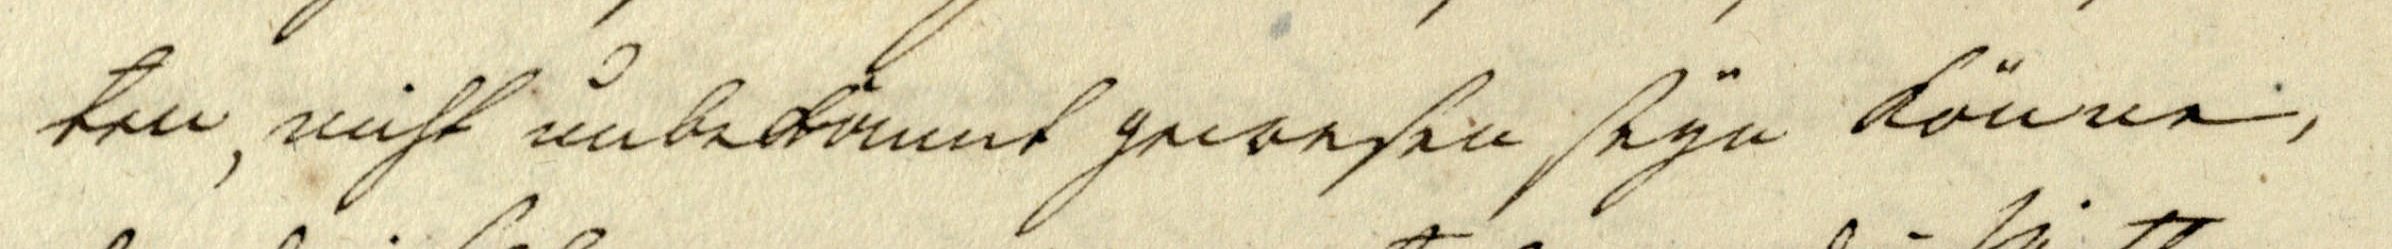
ten, nicht unbekannt gewesen seÿn könne,
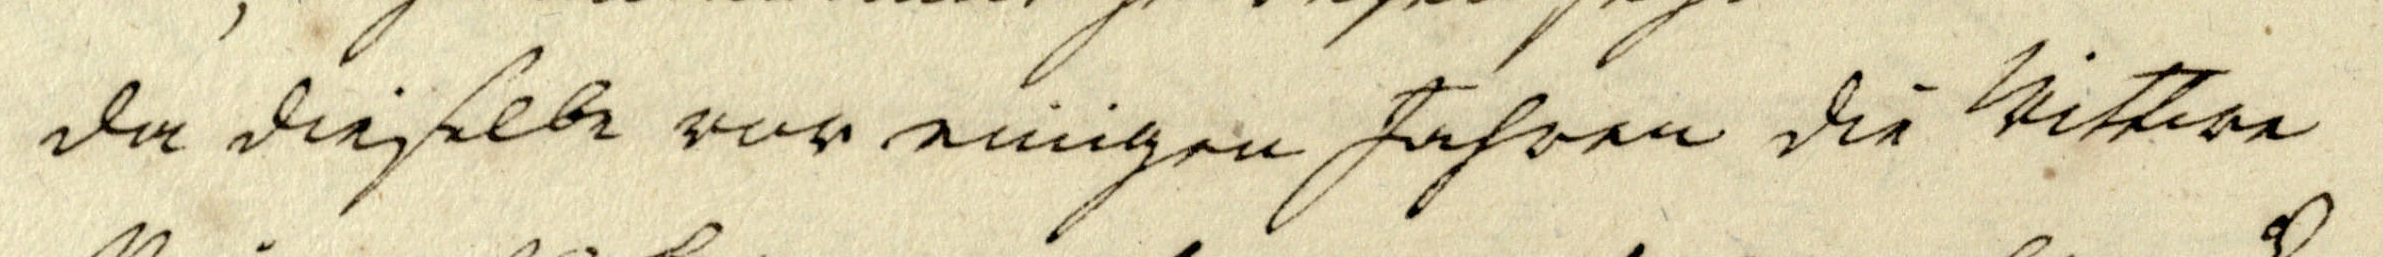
da dieselbe vor einigen Jahren die Wittwe
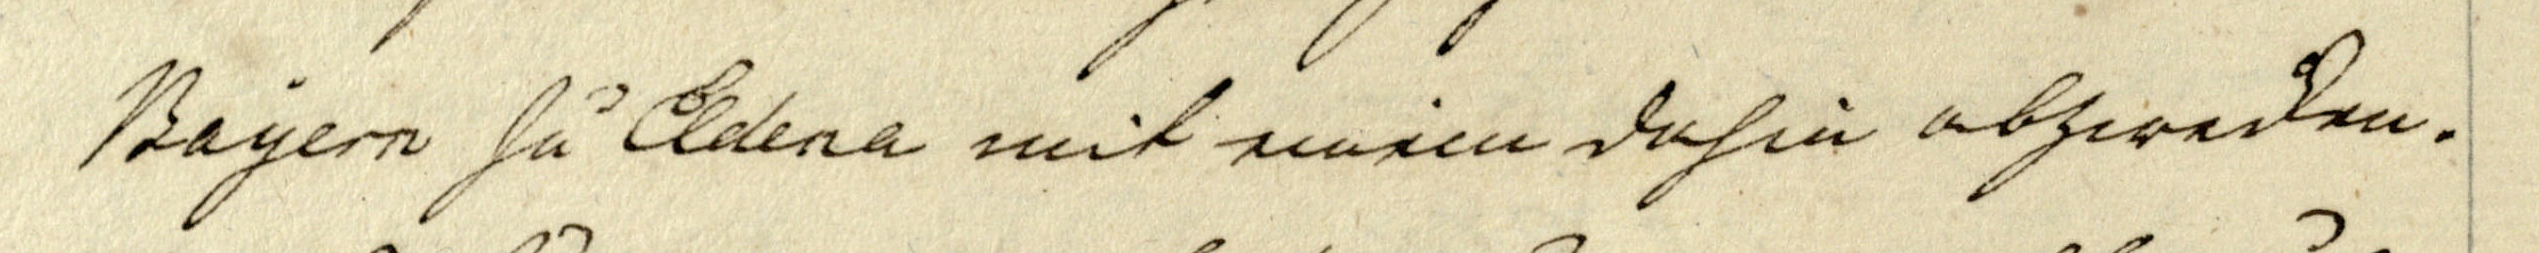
Baÿern zu Eldena mit einem dahin abzwecken¬
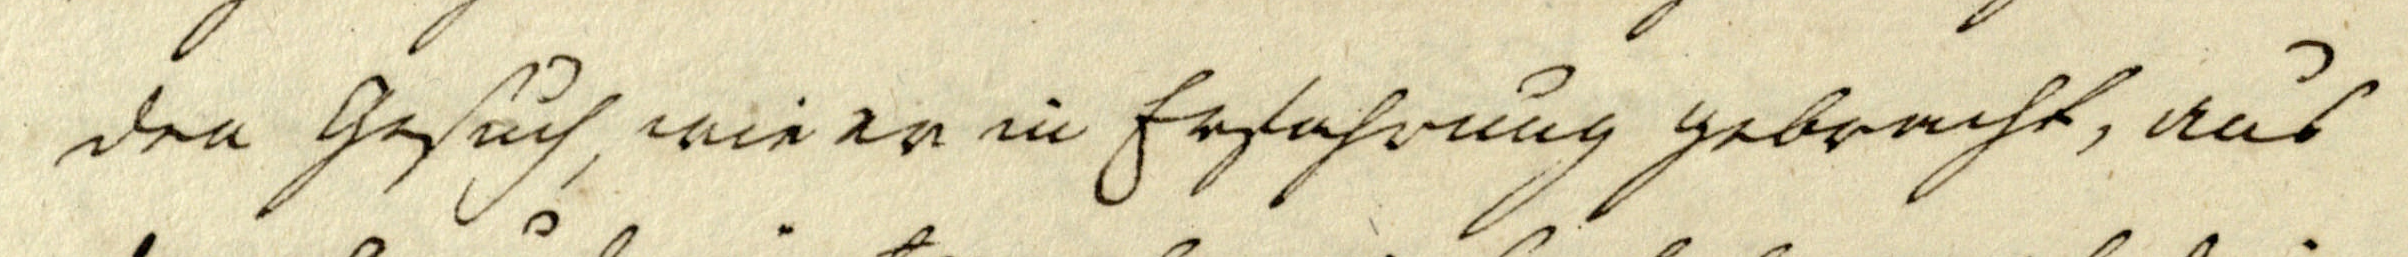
den Gesuch, wie er in Erfahrung gebracht, aus
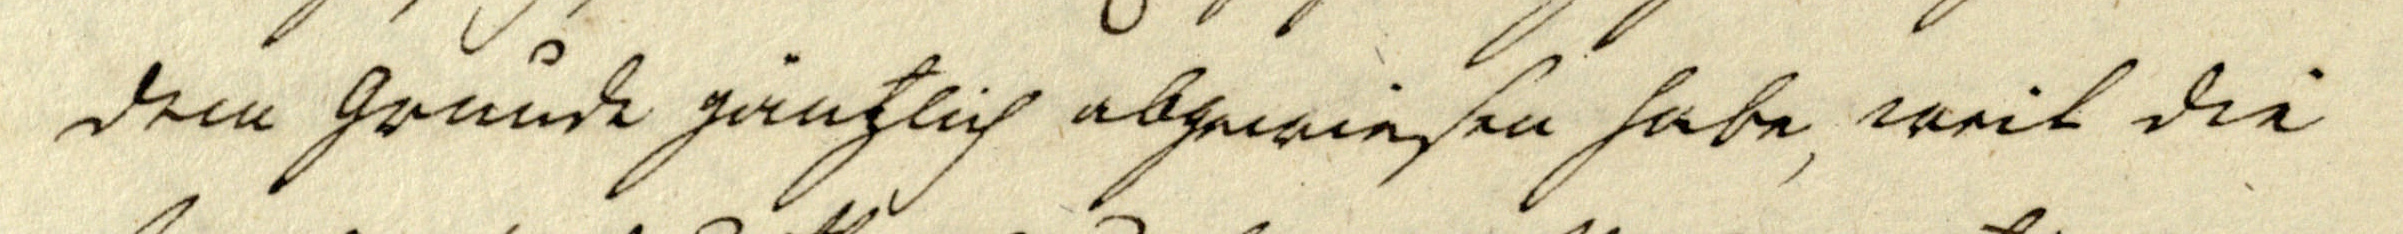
dem Grunde gäntzlich abgewiesen habe, weil die
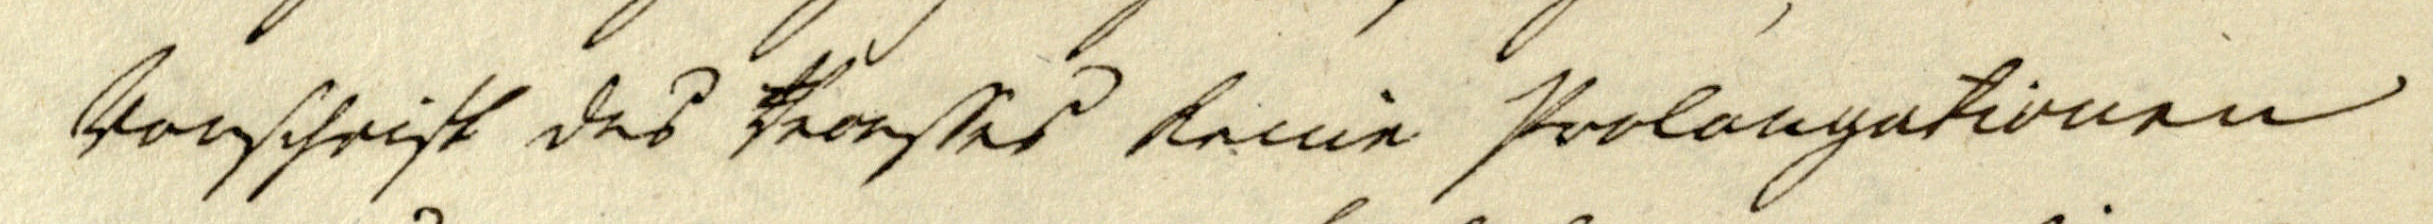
Vorschrift des Recesses keine Prolongationen
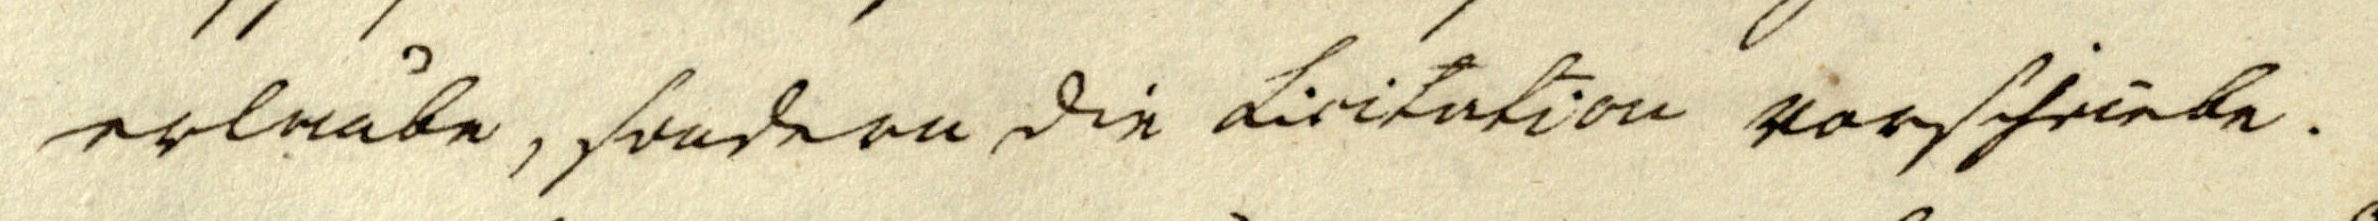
erlaube, sondern die Licitation vorschriebe.
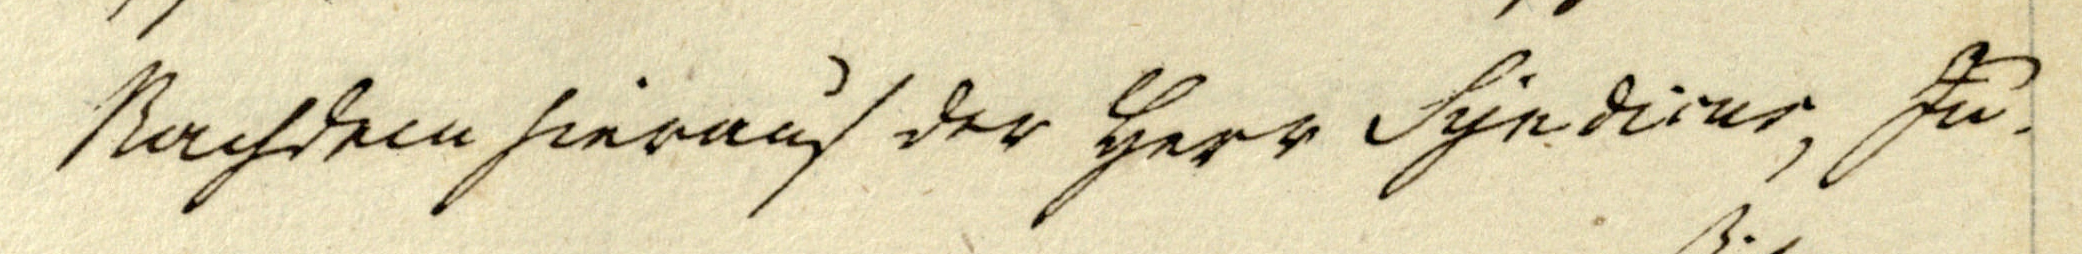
Nachdem hierauf der Herr Sÿndicus, Ju¬
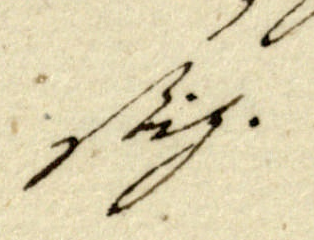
sti
